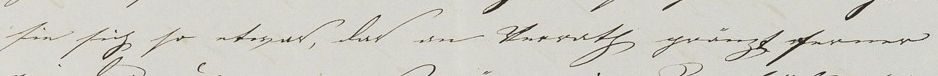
sie sich so etwas, das an Verrath gränzt ferner
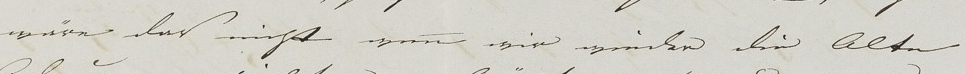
wäre das nicht wenn wir wieder die Alte
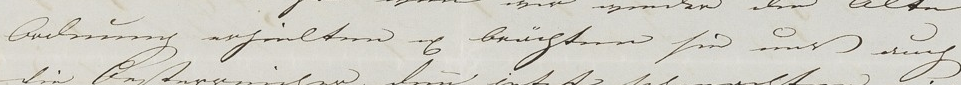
Ordnung erhielten & brächten sie uns auch
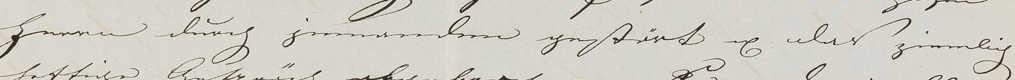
Herrn durch jemanden gestört & das ziemlich
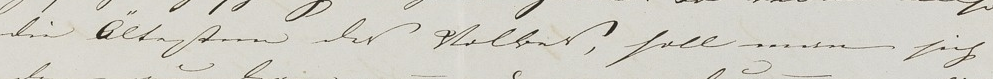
die Ältesten des Volkes, soll man sich
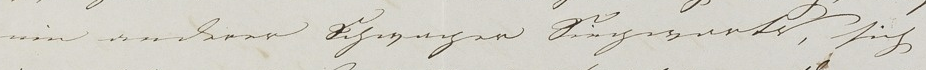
ein anderer SchwagerSiegwarts, sich
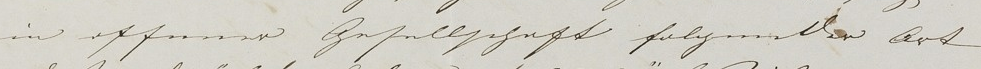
in offener Gesellschaft folgender Art
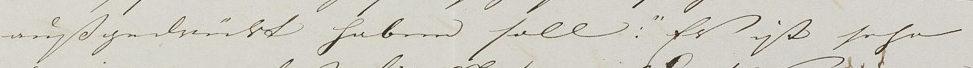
außgedrückt haben soll: «Es ist sehr
